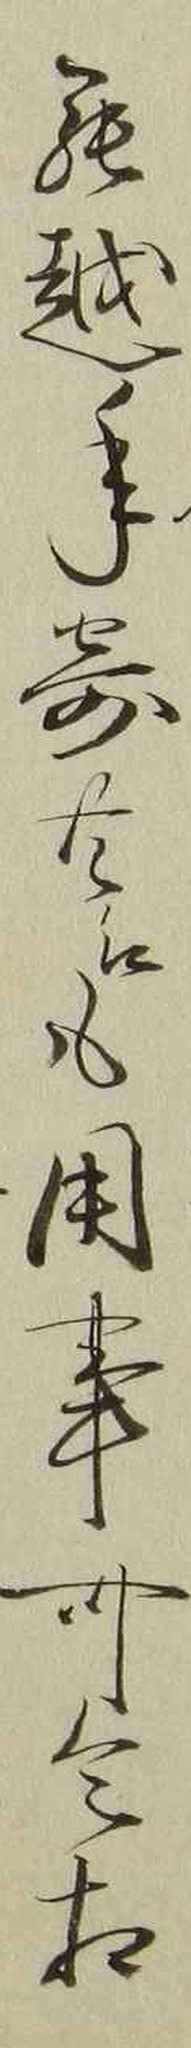罷越年寄共江も用事可令相
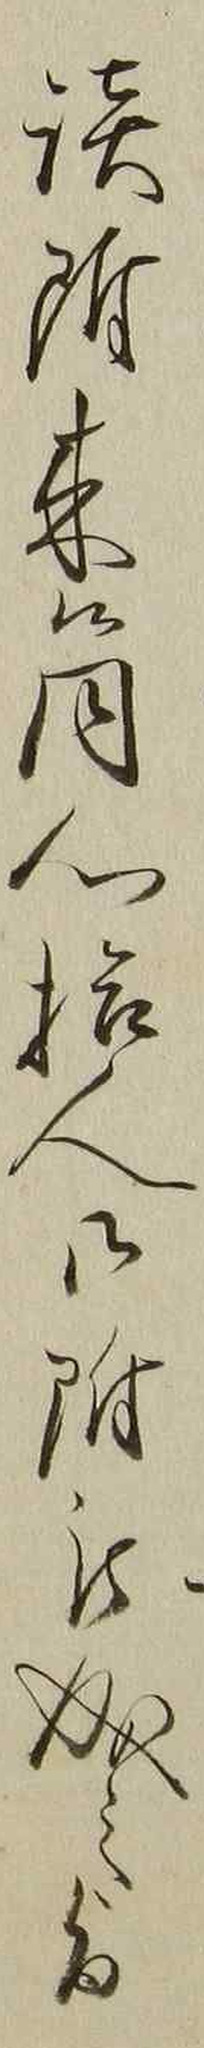談附来候同心拾人御附被成之旨
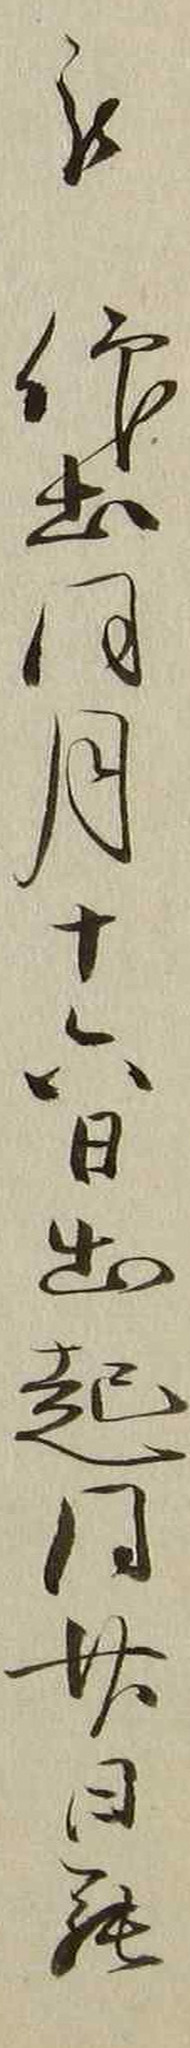被仰出同月十六日出起同廿日罷
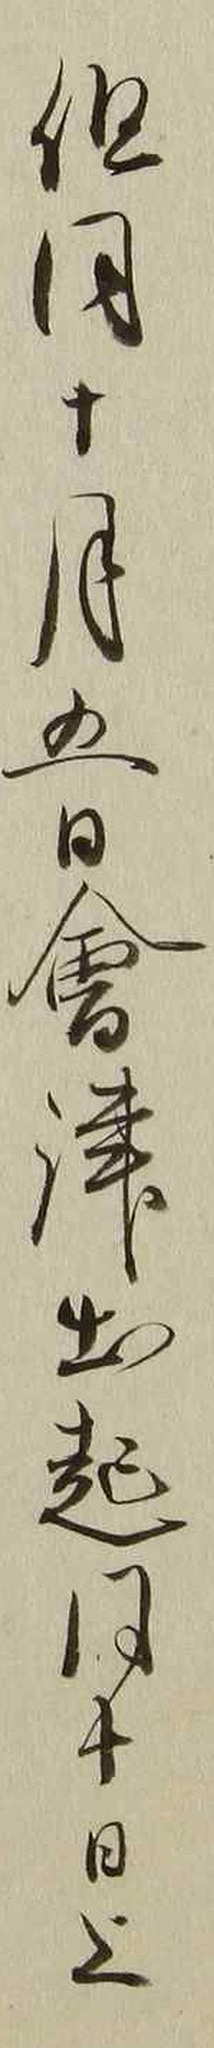但同十月五日会津出起同十日上
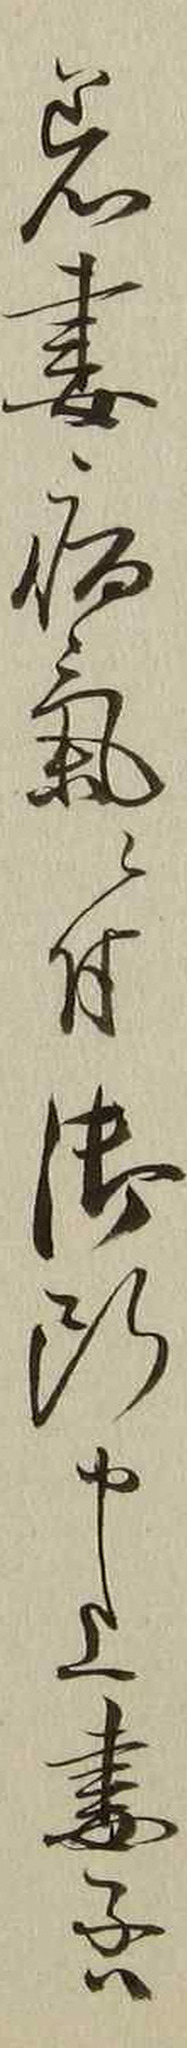着妻病気に付御断申上妻子は
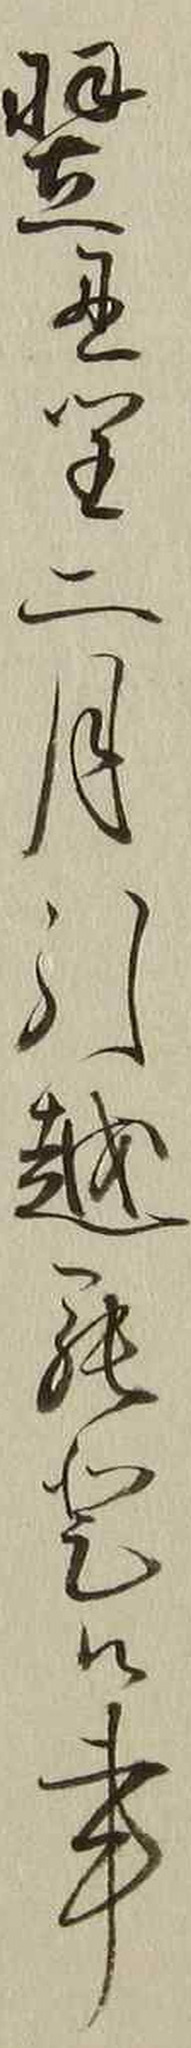翌丑閏二月引越罷登候事
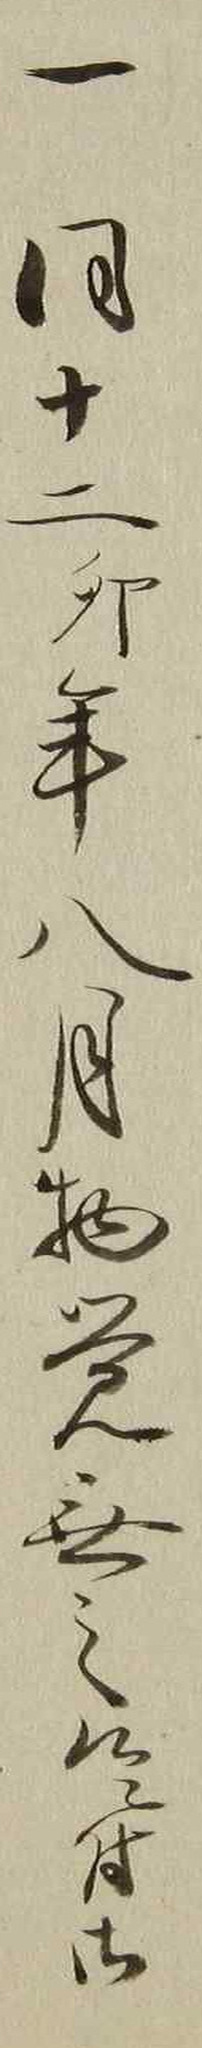一同十二卯年八月物覚無之候に付御
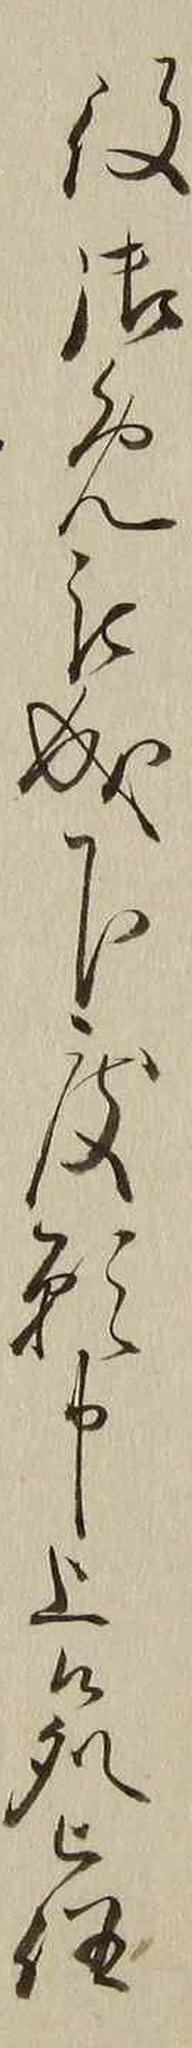役御免被成下度願申上候処被任
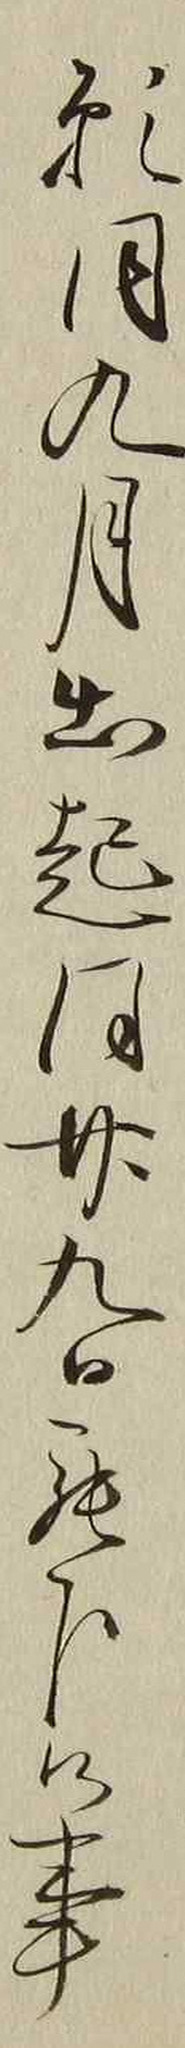願同九月出起同廿九日罷下候事
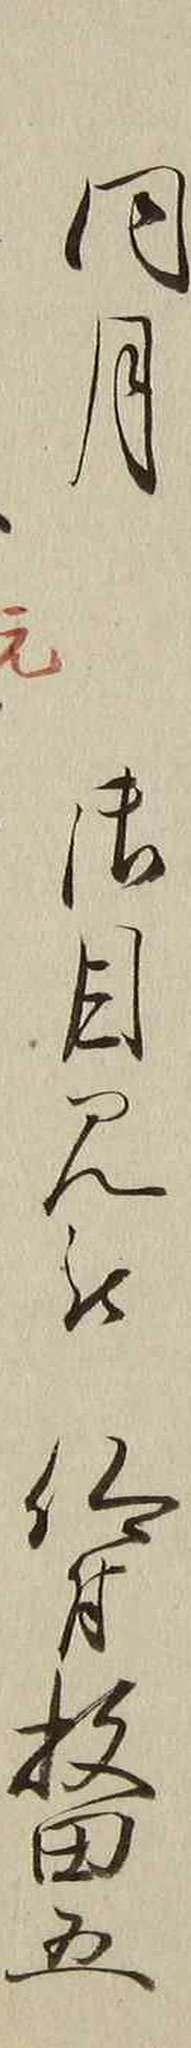一同月御目見被仰せ付枚田五
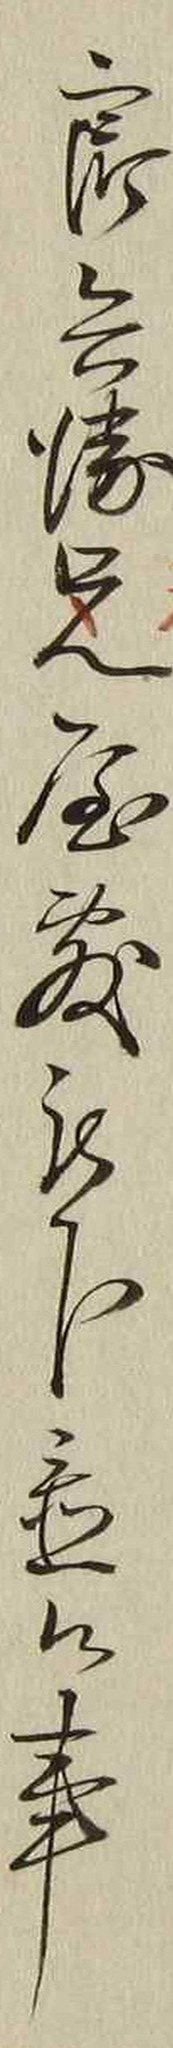郎兵衛兄屋敷被下置候事
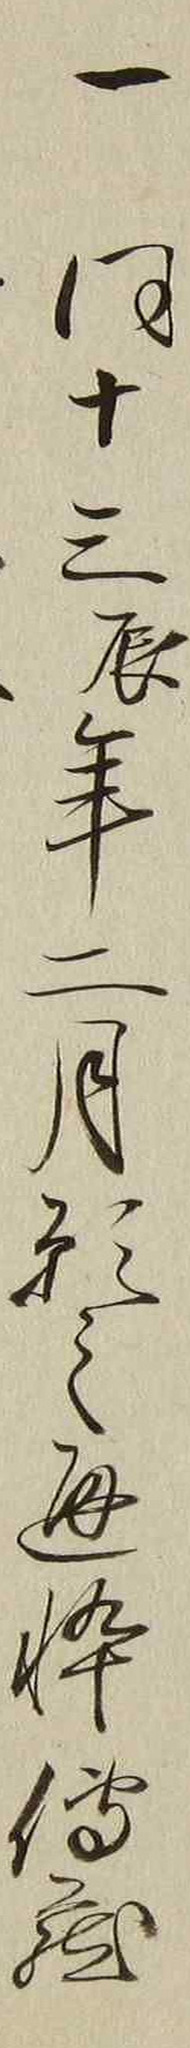一同十三辰年二月願之通忰伝蔵
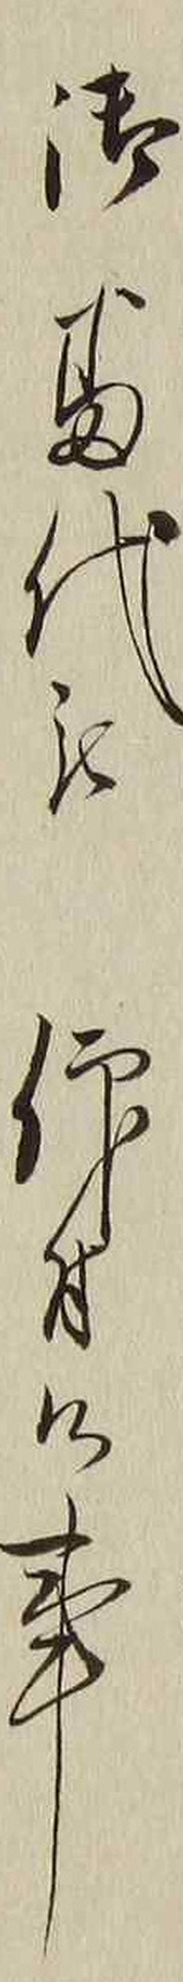御番代被仰付候事
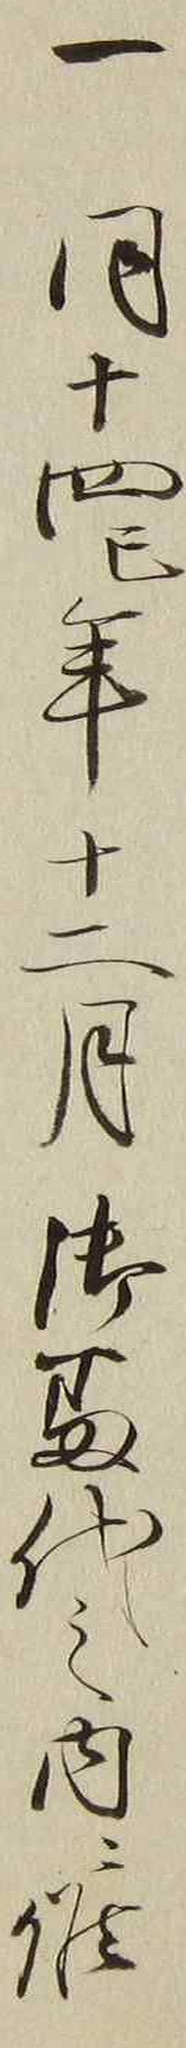一同十四巳年十二月御番代之内に候
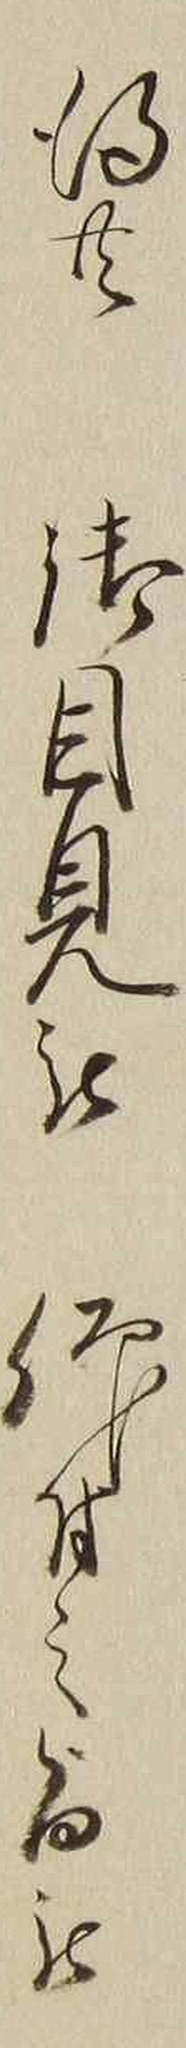得共御目見被仰付之旨被
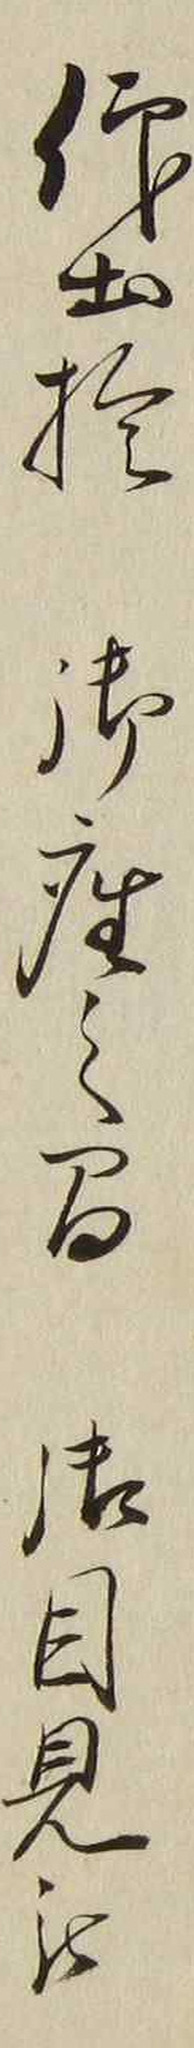仰出於御座之間御目見被
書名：諸士系譜　巻之103　か之部11
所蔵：会津若松市立会津図書館
